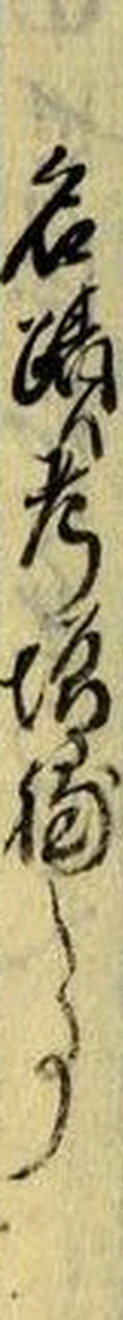名蹟考増補之事
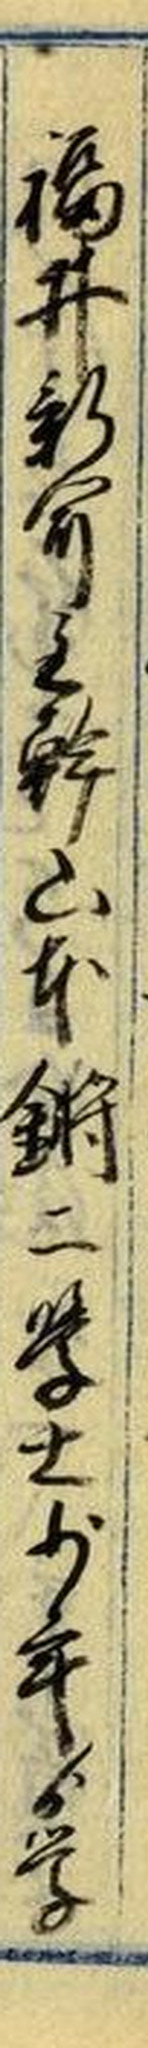福井新聞主幹山本鏘二学士少年ゟ学
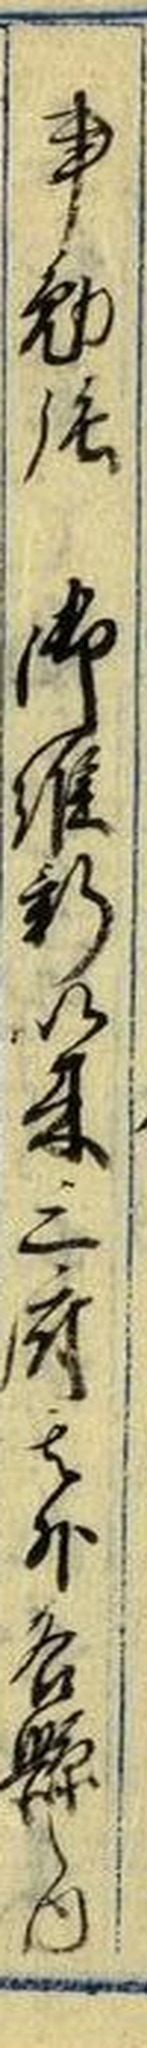事勉強御維新以来三府其外各縣之内
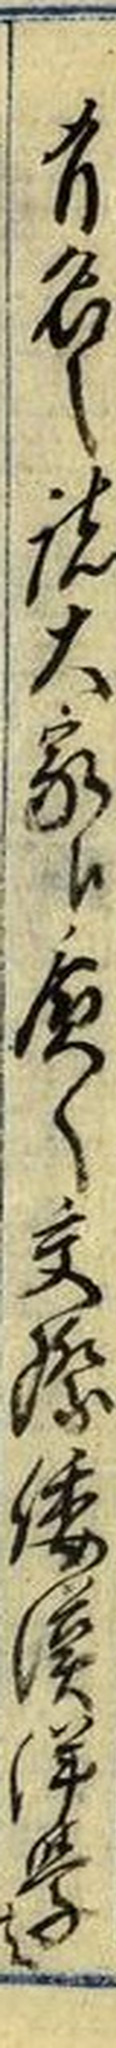有名之諸大家え広く交際倭漢洋学共
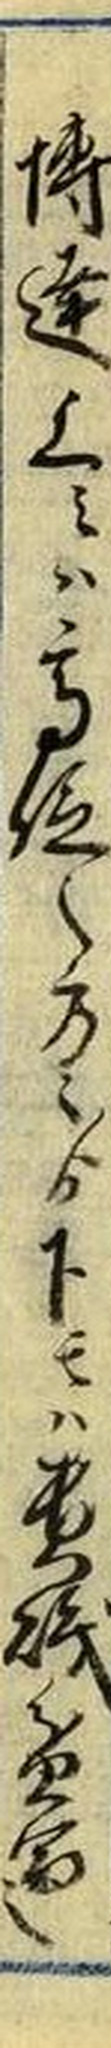博達上みは高位之方々ゟ下もは貴賤貧富之
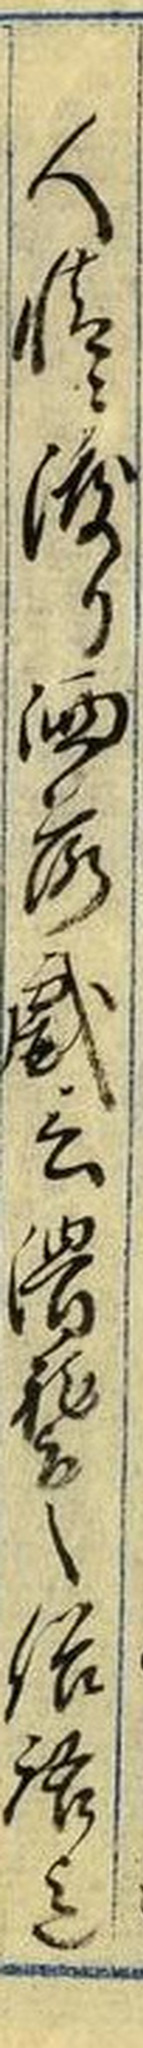人情に渡り洒落戯言滑稽之俗語迄
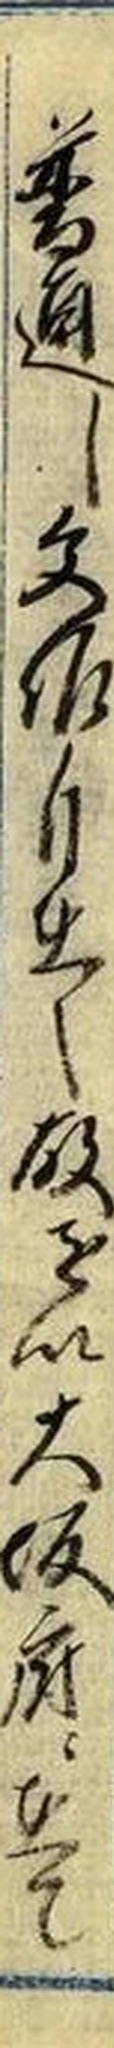普通し文作自在之故を以大阪府に在て
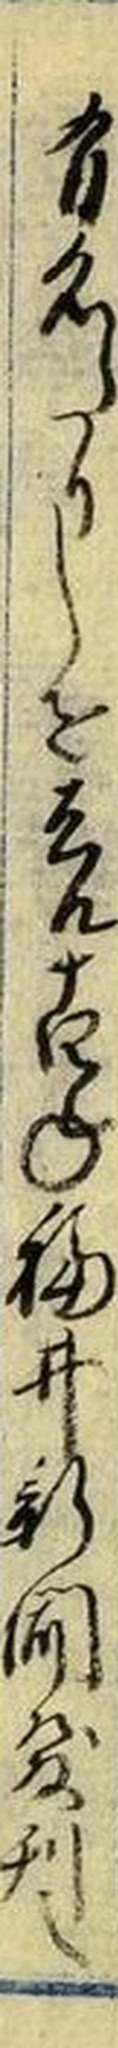有名たりしを去る十四年福井新聞発刊之
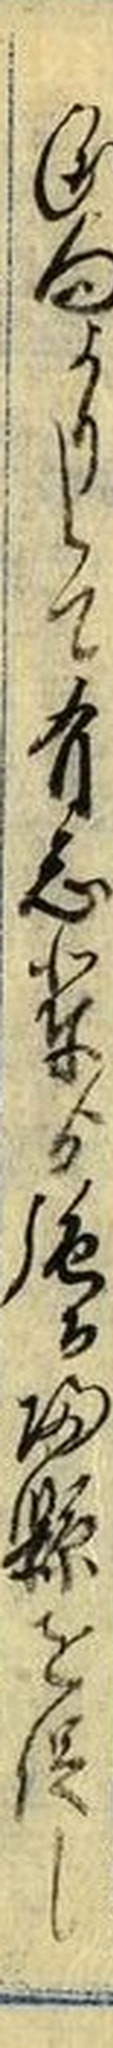趣向よりして有志輩ゟ強而帰縣を促し
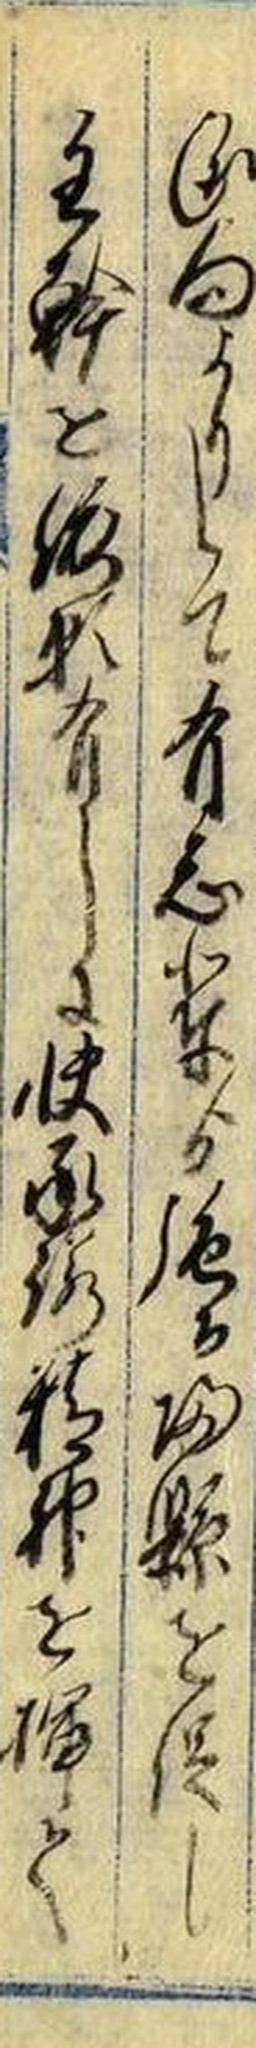主幹を依頼有しに快承諾精神を揮て

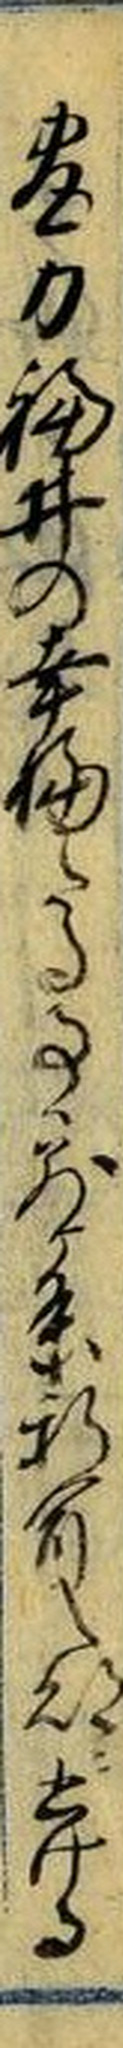尽力福井の幸福たる事別ヶ条新聞之部に書ける
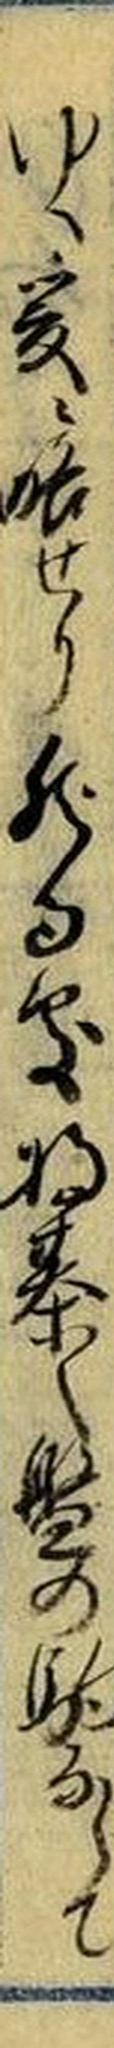ゆへ爰に略せり然る処将棊之盤の駒ならて
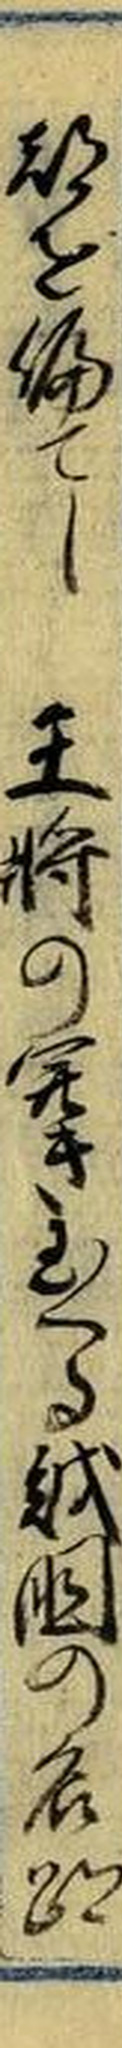部を編てし王将の開き玉へる越国の名跡
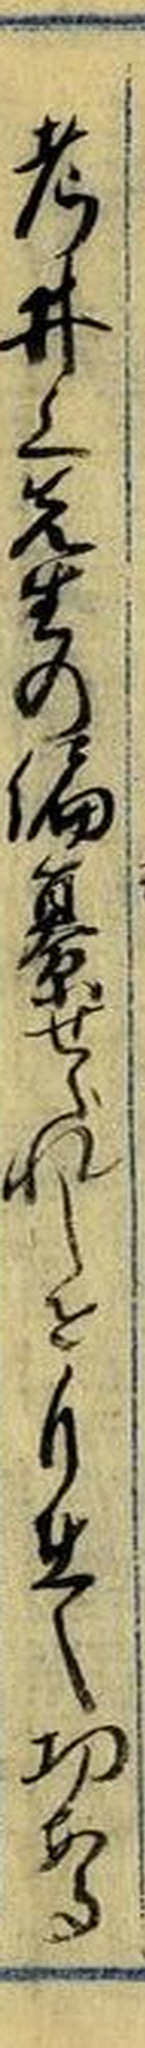考井上先生の編纂せられしを自在の功ある
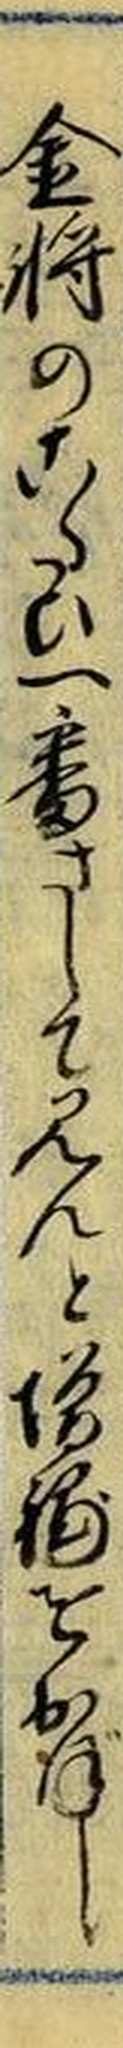金将のこたひ一番さして見んと増補をおぼし
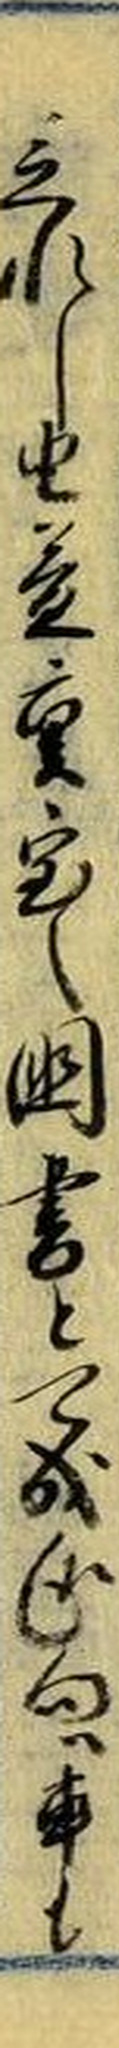立れし由益重宝之国書と可成趣向は車も
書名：温古集 四巻
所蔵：福井県文書館 Fukui Prefectural Archives
